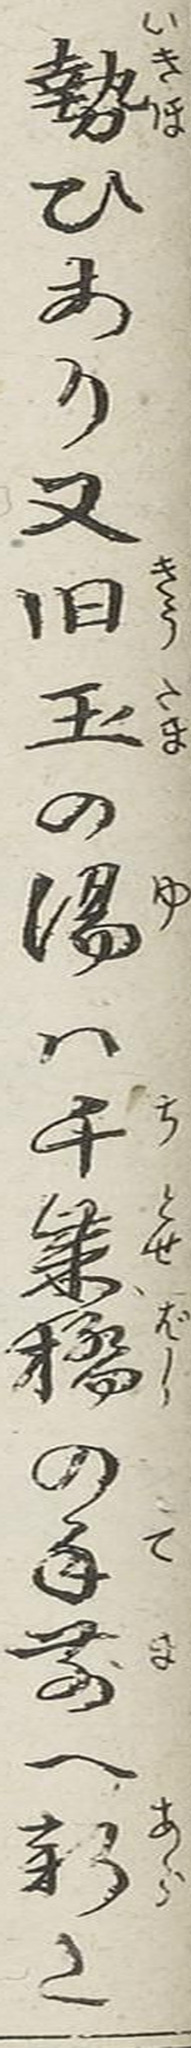勢ひあり又旧玉の湯は千歳橋の手前へ新た
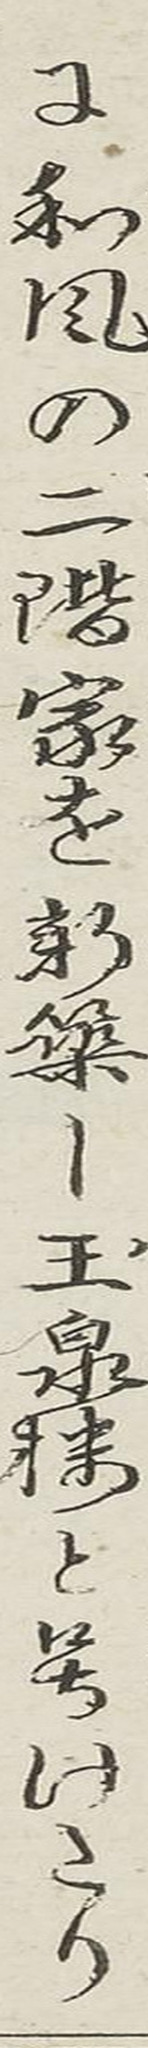に和風の二階家を新築し玉泉楼と号けたり
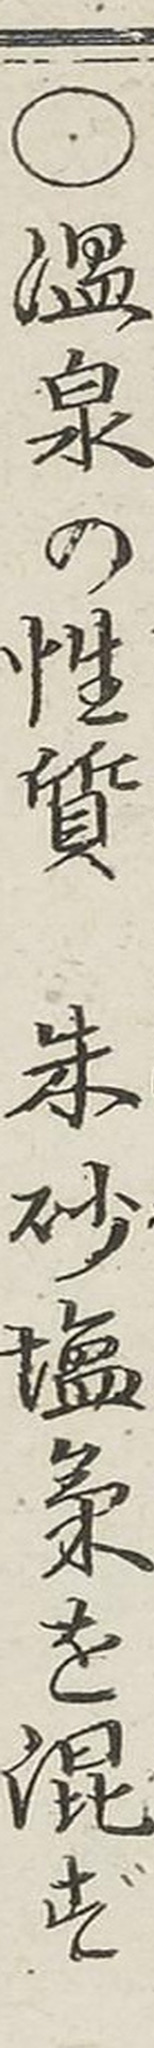○温泉の性質朱砂塩気を混ず
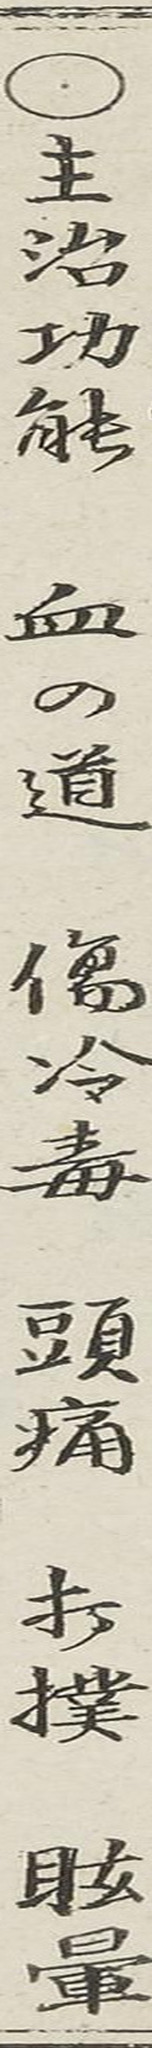○主治功能血の道傷冷毒頭痛打撲眩暈
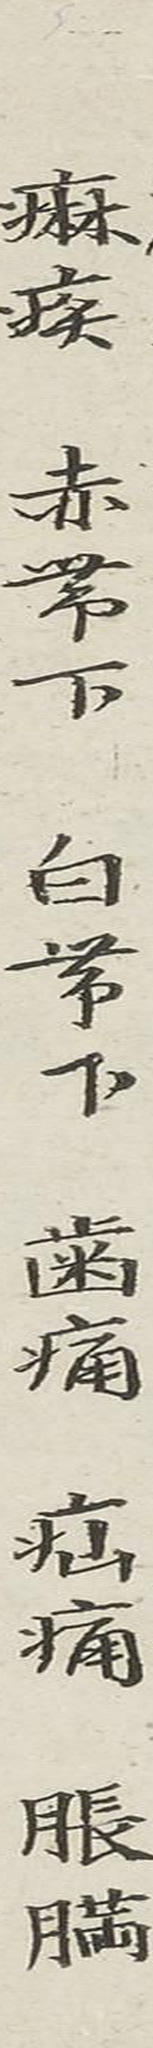痳疾赤帯下白帯下歯痛疝痛脹満
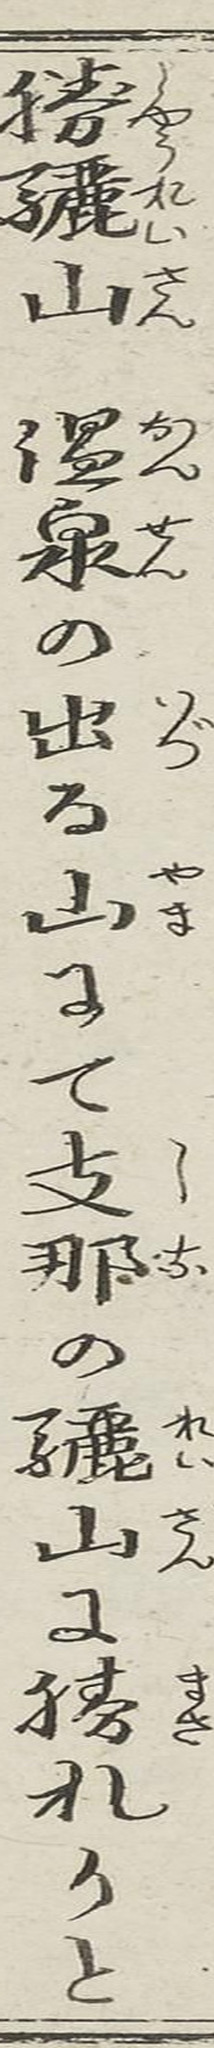勝驪山温泉の出る山にて支那の驪山に勝れりと
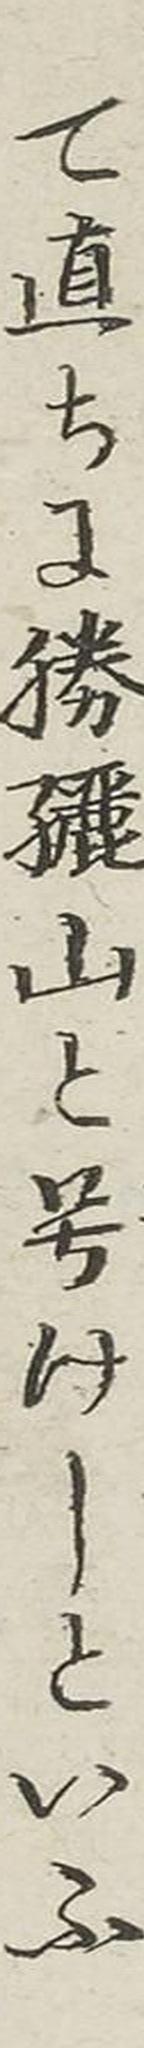て直ちに勝驪山と号けしといふ
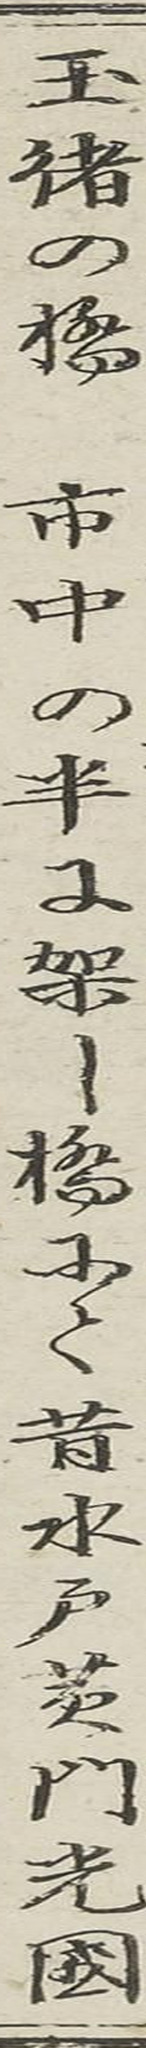玉緒の橋市中の半に架し橋にて昔水戸黄門光國

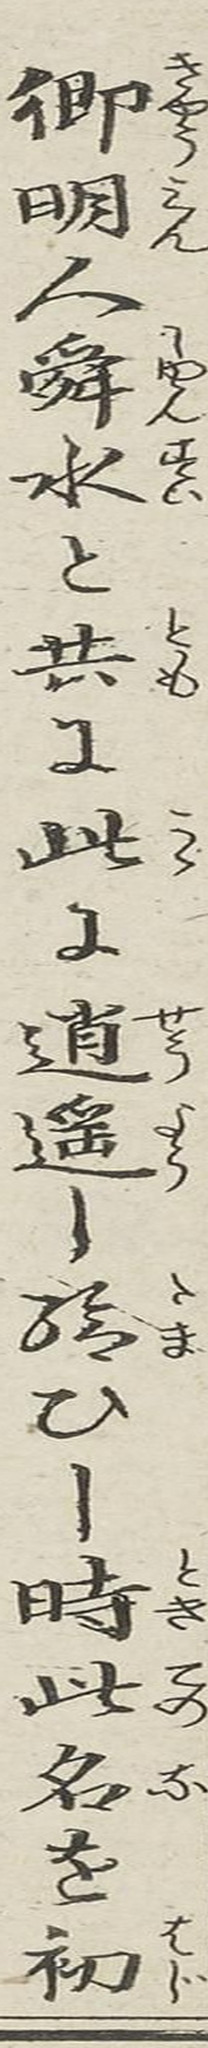卿明人舜水と共に此に逍遥し給ひし時此名を初
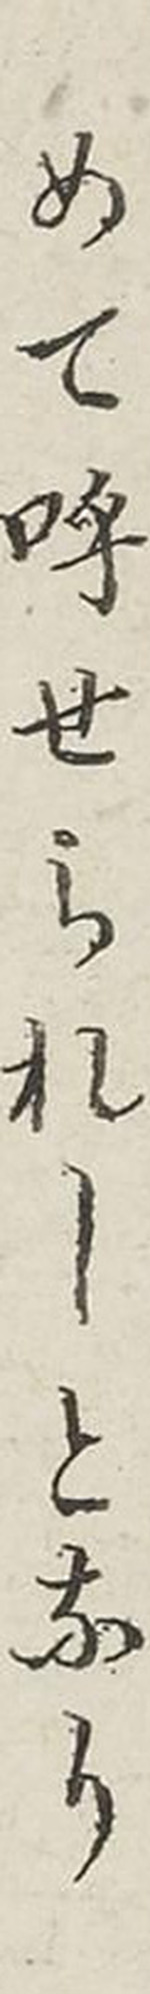めて呼せられしとなり
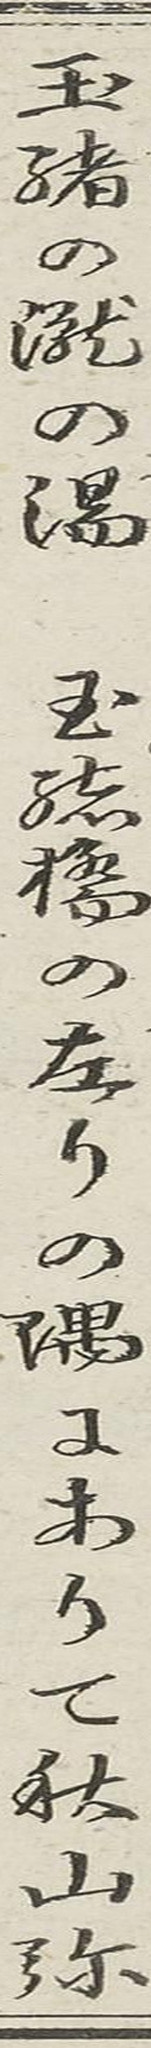玉緒の瀧の湯玉緒橋の左りの隅にありて秋山弥
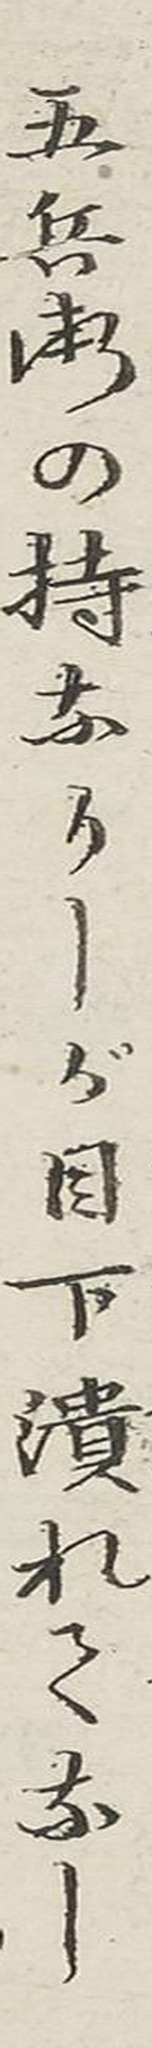五兵衛の持なりしが目下潰れてなし
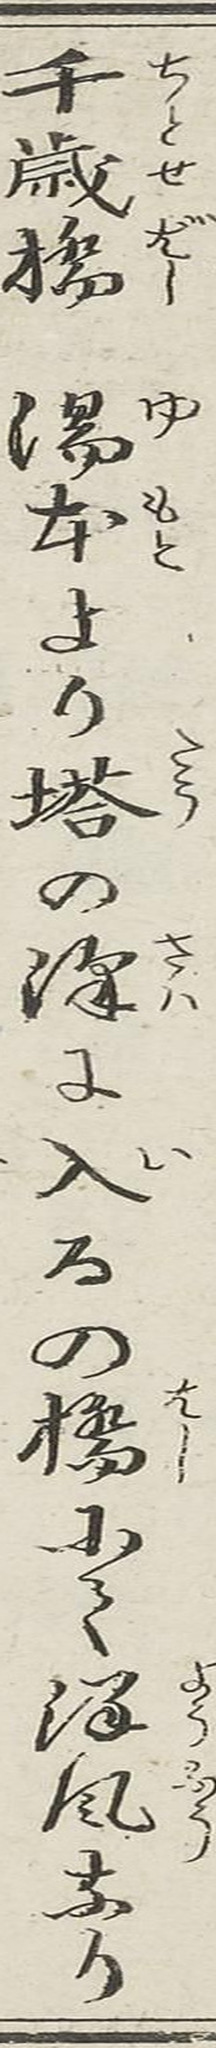千歳橋湯本より塔の澤に入るの橋にて洋風なり
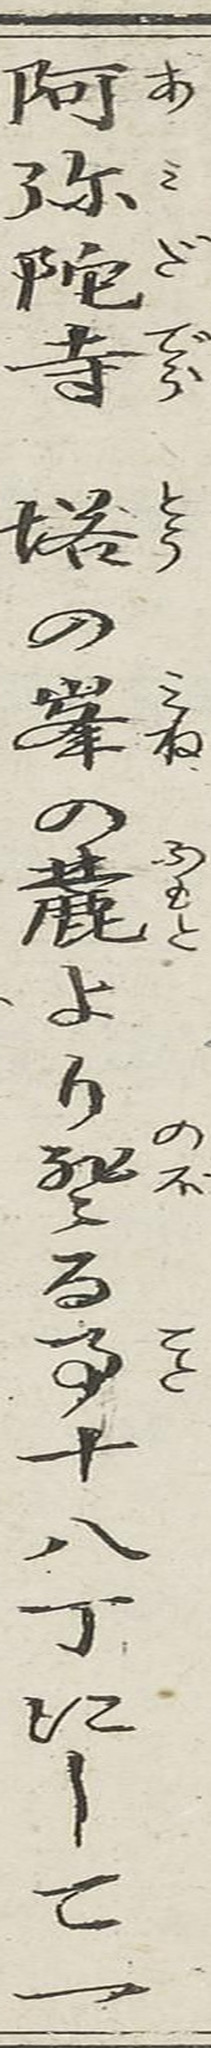阿弥陀寺塔の峯の麓より登る事十八丁にして一
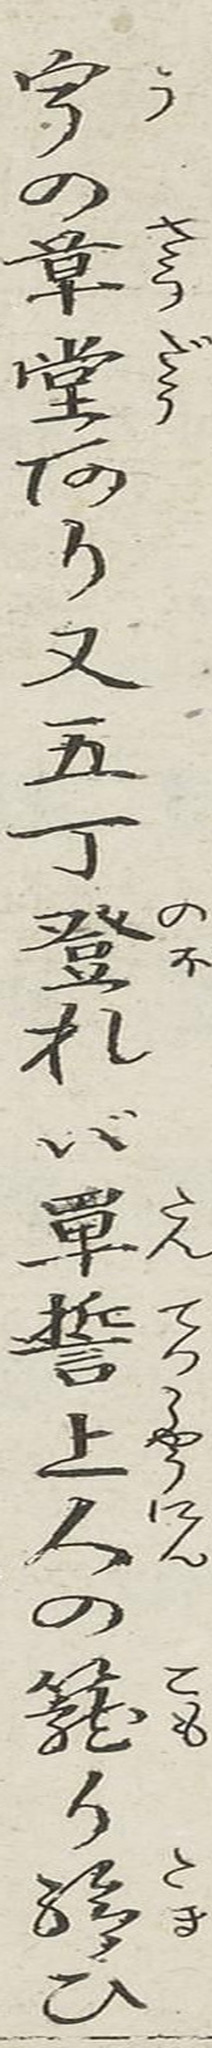宇の草堂あり又五丁登れば単誓上人の蔵り給ひ
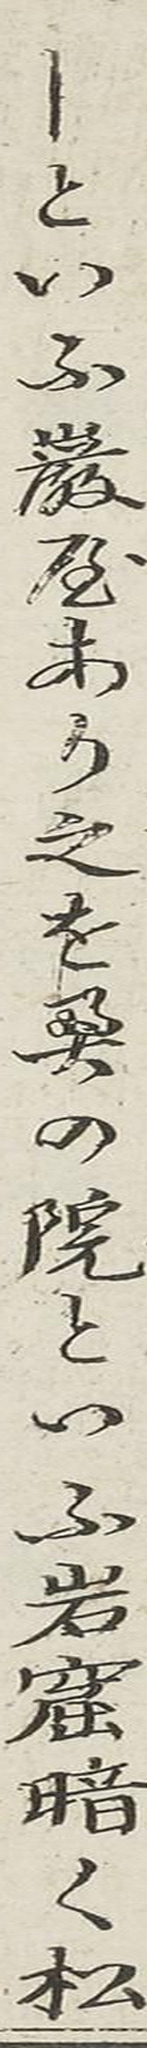しといふ巌屋あり之を奥の院といふ岩窟暗く松
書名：箱根温泉誌　全
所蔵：東京大学地震研究所図書室 Earthquake Research Institute Library, The University of Tokyo, JAPAN
